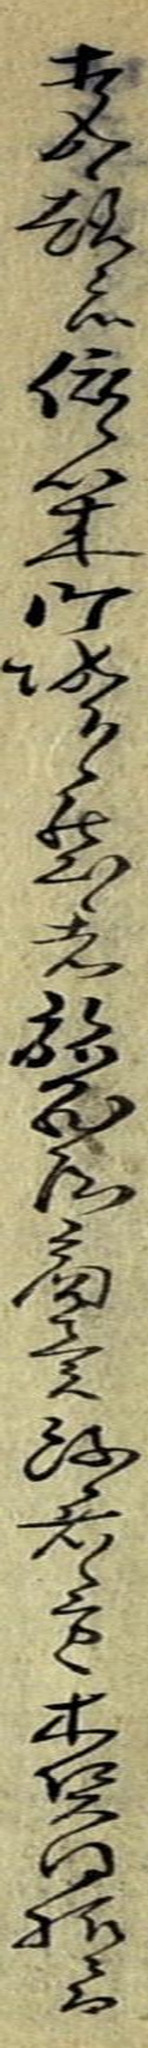相成候趣ニ候依之以来御城下へ罷出候者旅籠屋商売致候者之方へ木賃同様ニ而
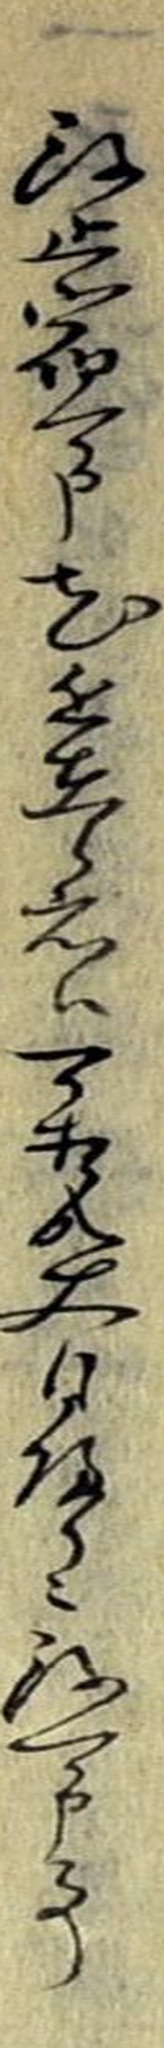致止宿可申尤近在之者ハ可相成丈日帰りニ致可申事
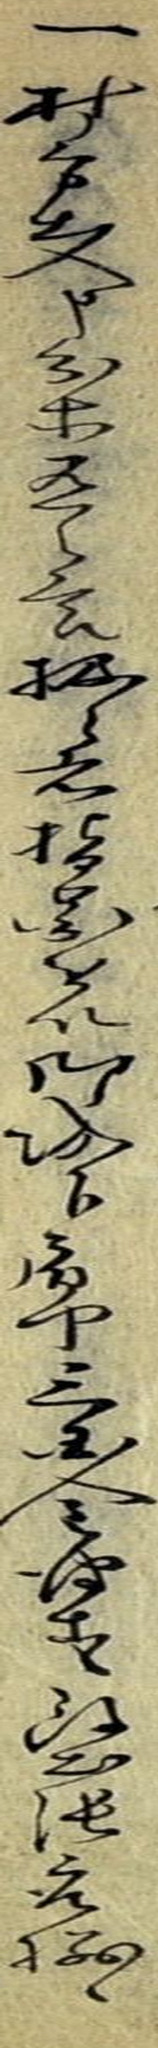一村方出入申分等有之節扱之者指図を以御城下府中三国金津等へ致出張取揃候
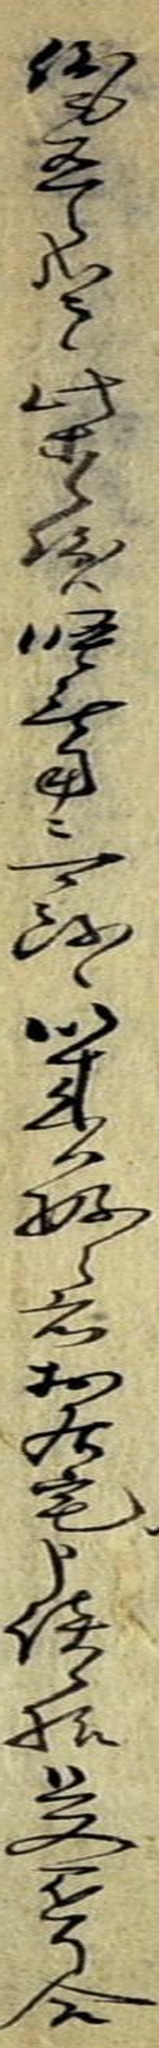儀も有之哉ニ候此等之儀ハ堅無用ニ可致候以来ハ扱之者於居宅申談候様且又懸り合
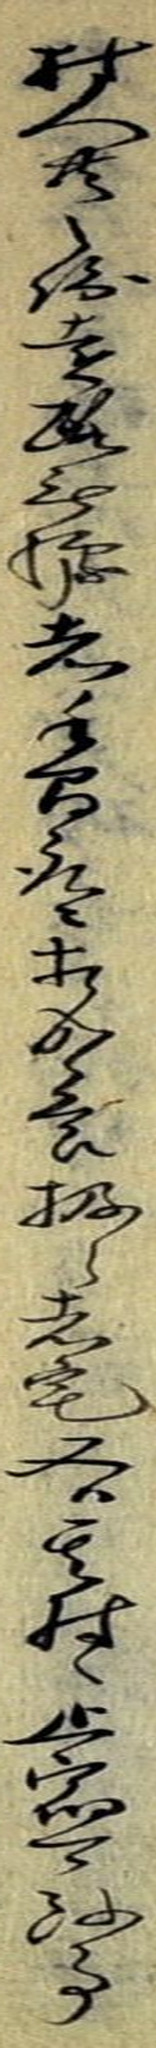村人共之儀遠路無拠者手間取ニ相成候節扱之者宅又ハ其村へ止宿可致事
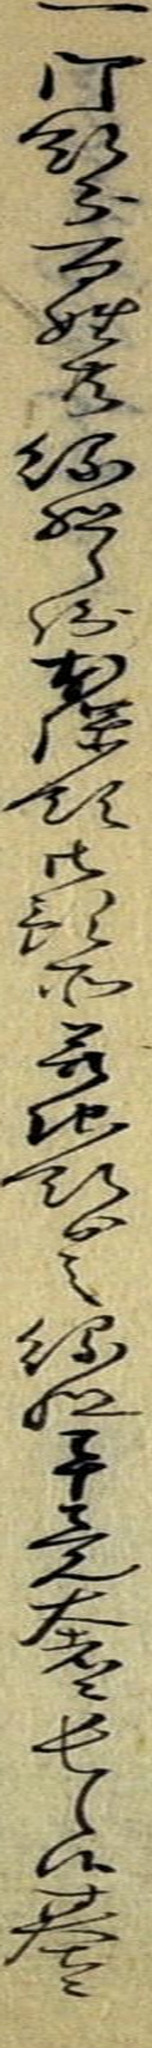一御領分百姓共縁組之儀本保領御預所并他領ゟ之縁組畢竟奢ニ長し候基ニ
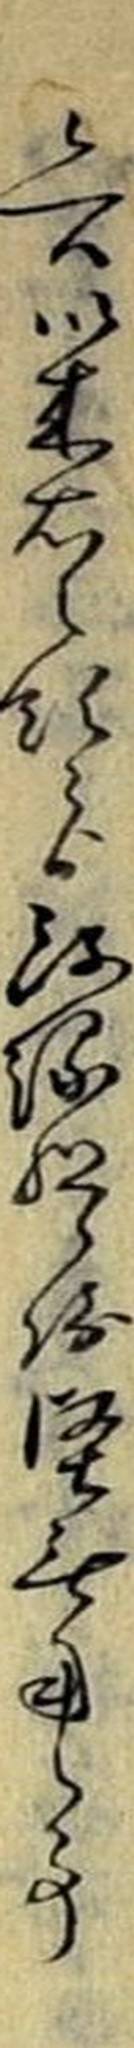候へハ以来右之領ニゟ致縁組候儀堅無用之事
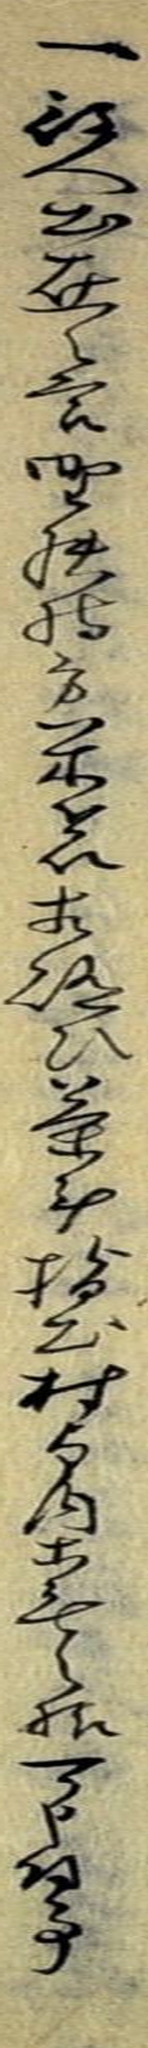一役人出在之節町扶持方米を以相賄ひ茶計指出村ゟ内等無之様可申付事
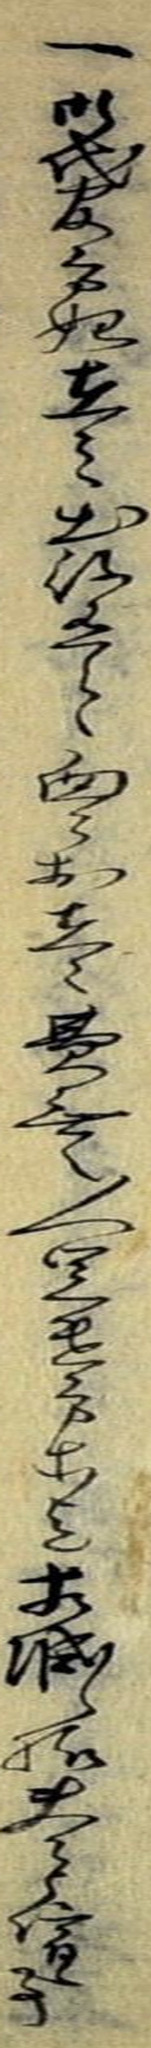一御代官方始在々へ出役有之候面々於在々費無之人足遣方等迄相減候様夫々被仰付候事
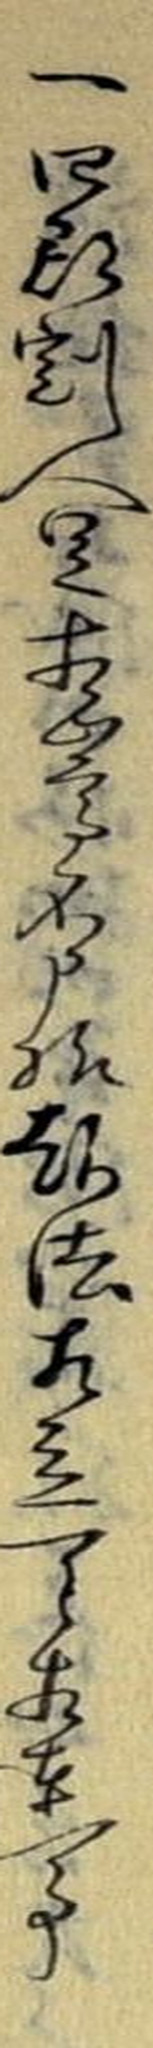一四郡割人足相嵩不申様趣法相立可被相達事
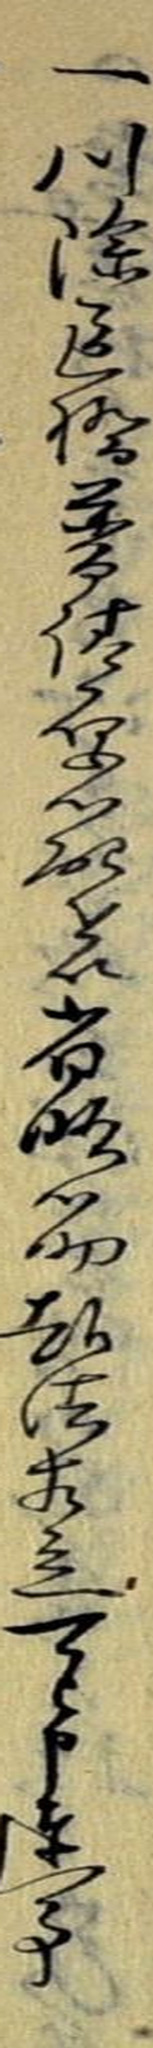一川除道橋普請厚心配を以省略筋趣法相立可被申達事
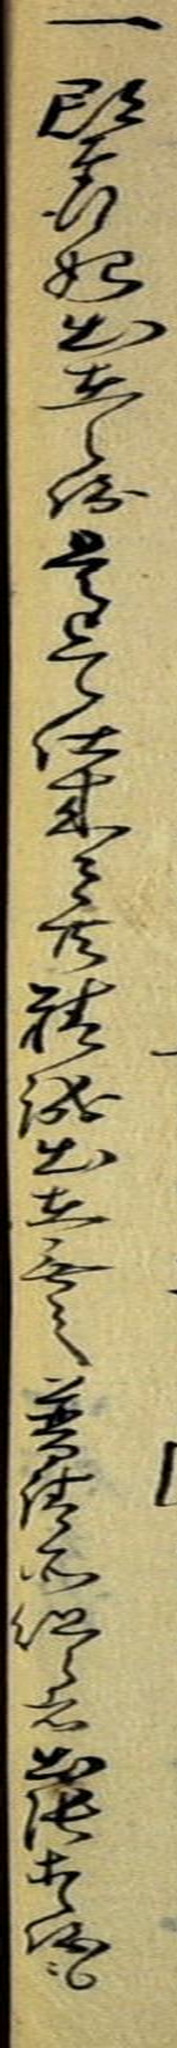一郡奉行始出在之儀是迄之仕来ニ候共精誠出在無之普請所組之者出張等之儀も
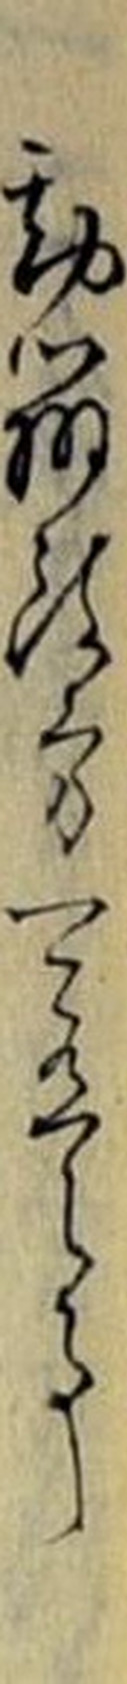勘弁致方可有之事
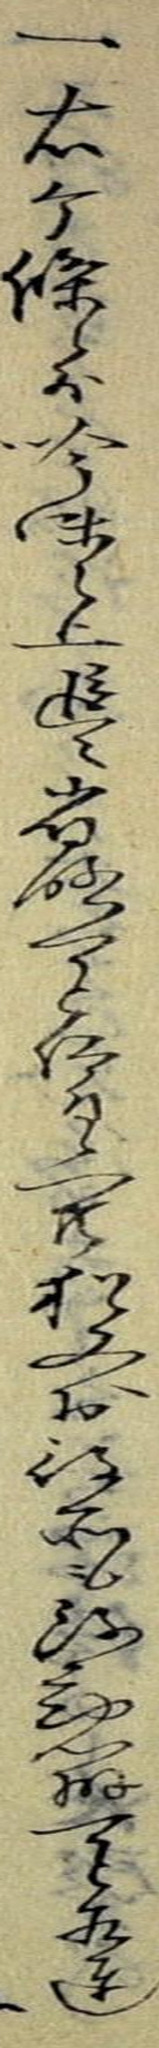一右ケ条之外吟味之上追々省略可被仰付候へ共猶又於役所も致勘弁可被相達候
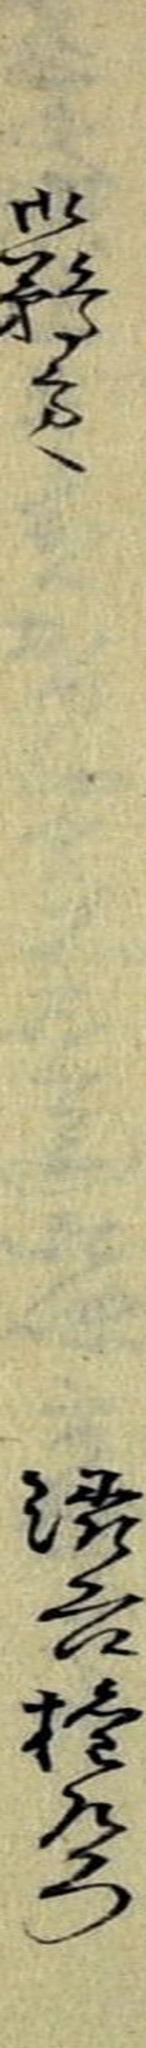御鵜方へ渋谷権左衛門
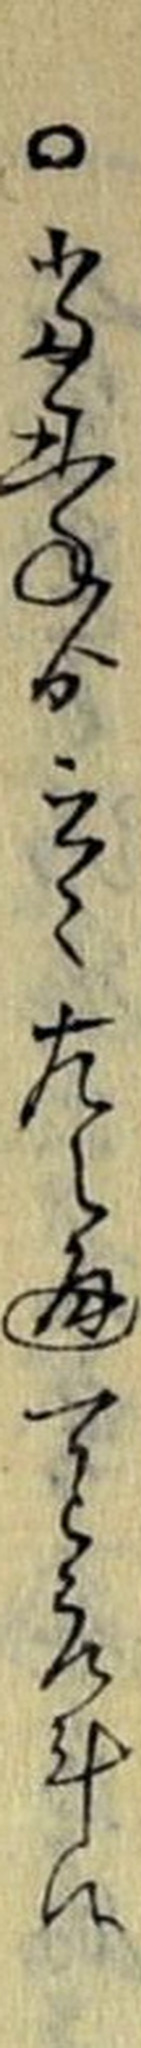○当丑年ゟ云々左之通可被取計候
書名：命令之部 五
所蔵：福井県文書館 Fukui Prefectural Archives
